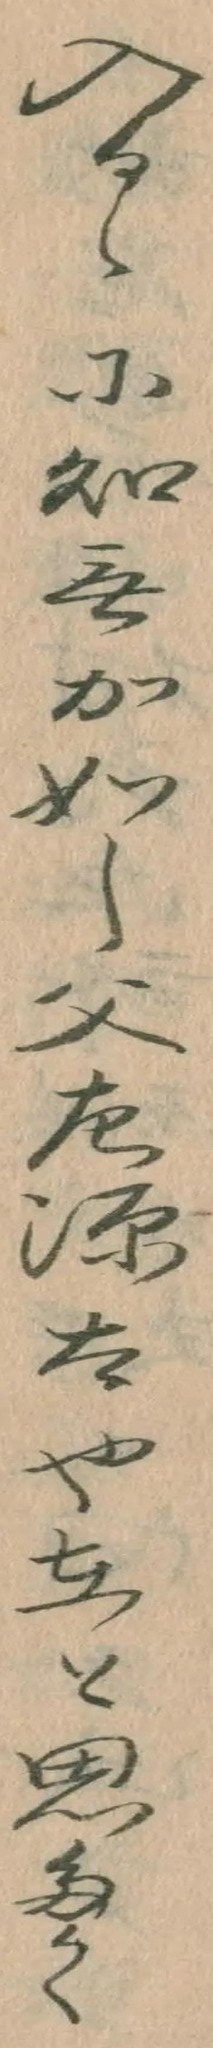入るゝ尓処無加如し父左源太や在と思多く
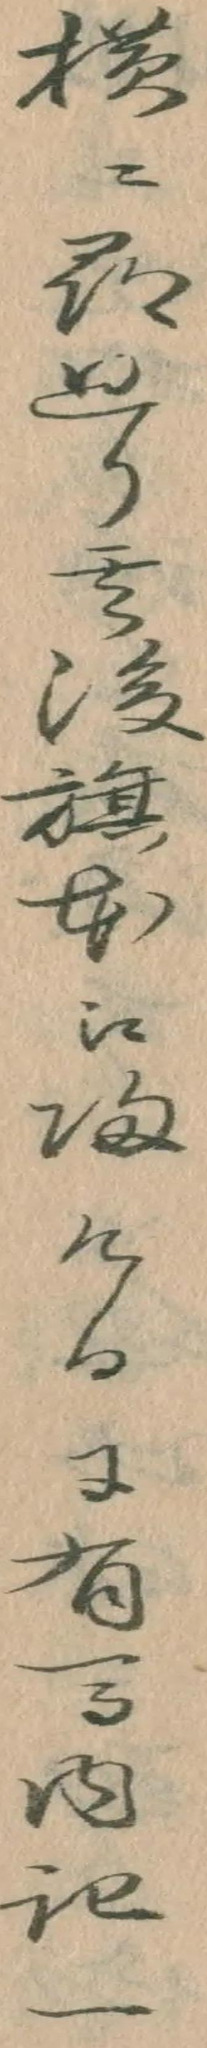横に尋廻り其後旗本江帰ける尓有馬内記一
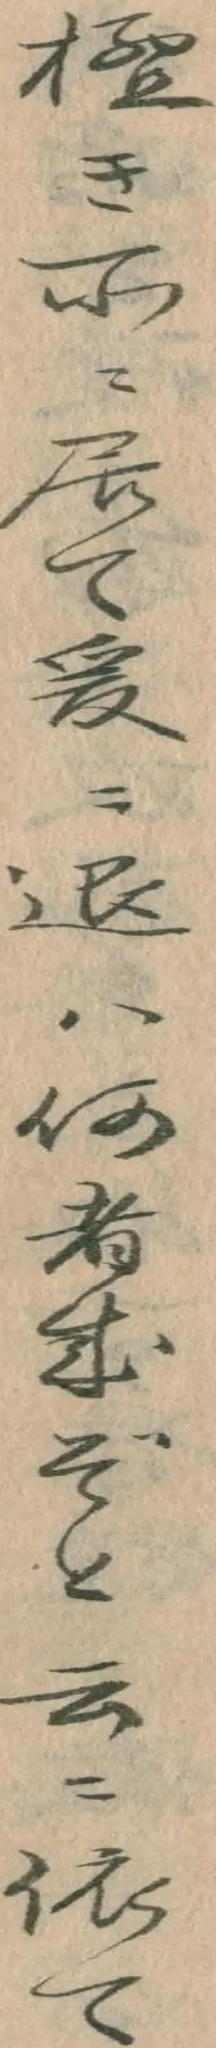檀き所に居て爰に退は何者成ぞと云に依て
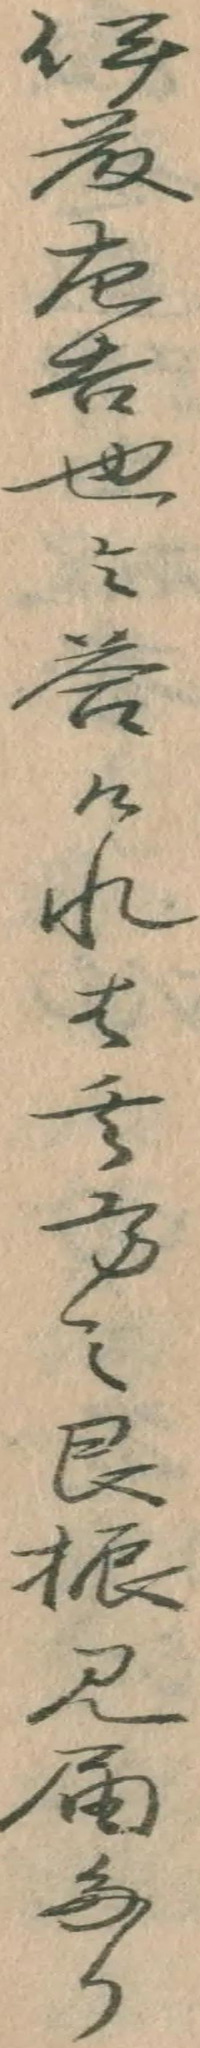伊藤左吉也与答けれ者其方之艮振見届多り
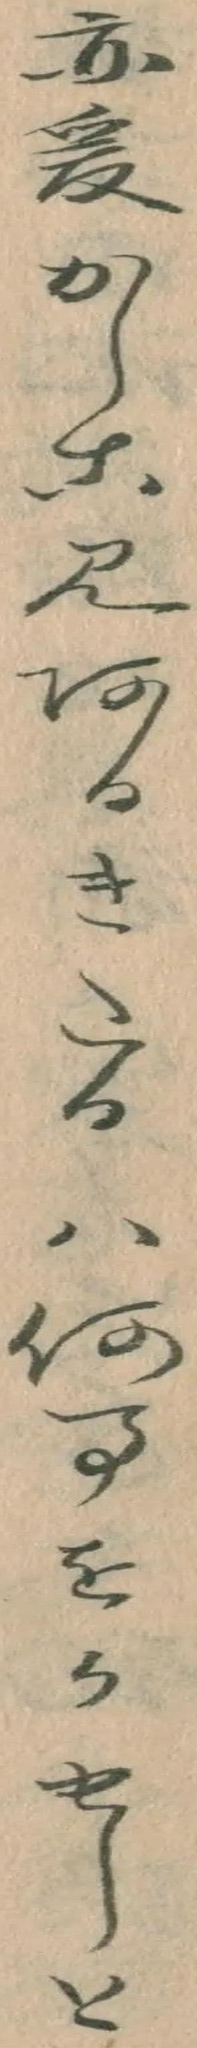亦爰かし古見阿るきたるは何事をかせしと
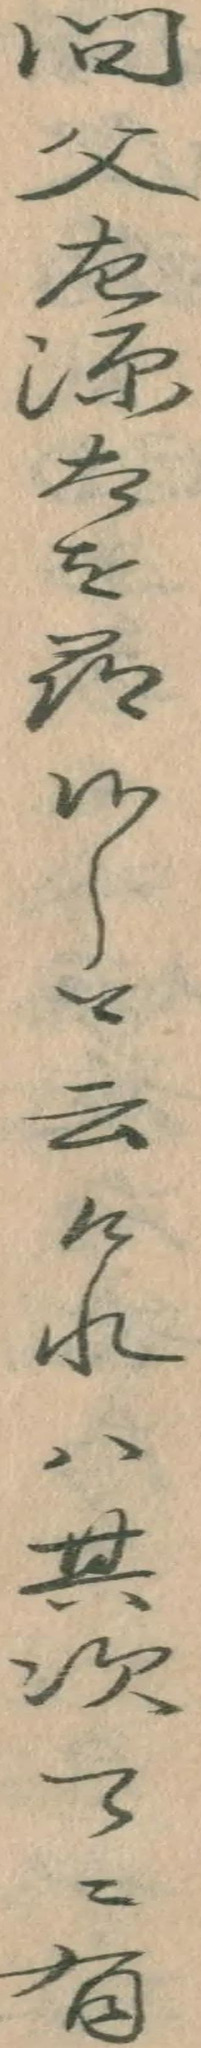問父左源太を尋候しと云けれは其次てに有
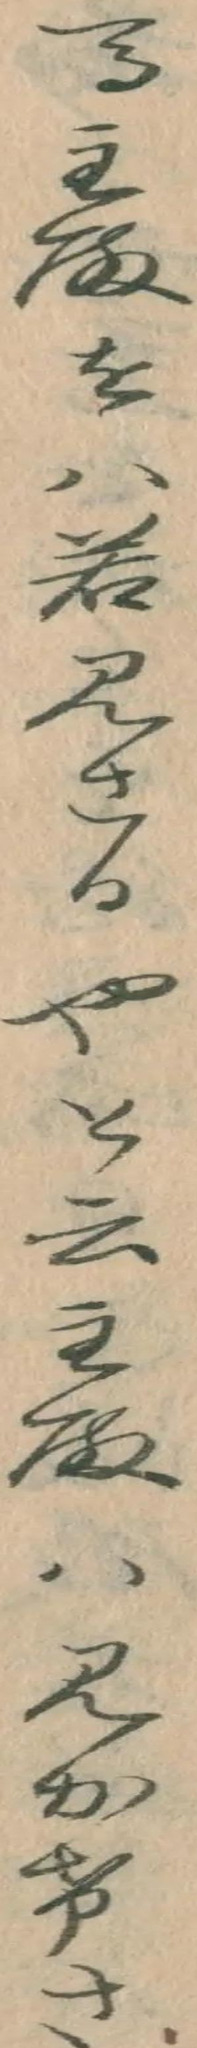馬主殿をは若見さるやと云主殿は見か希さ
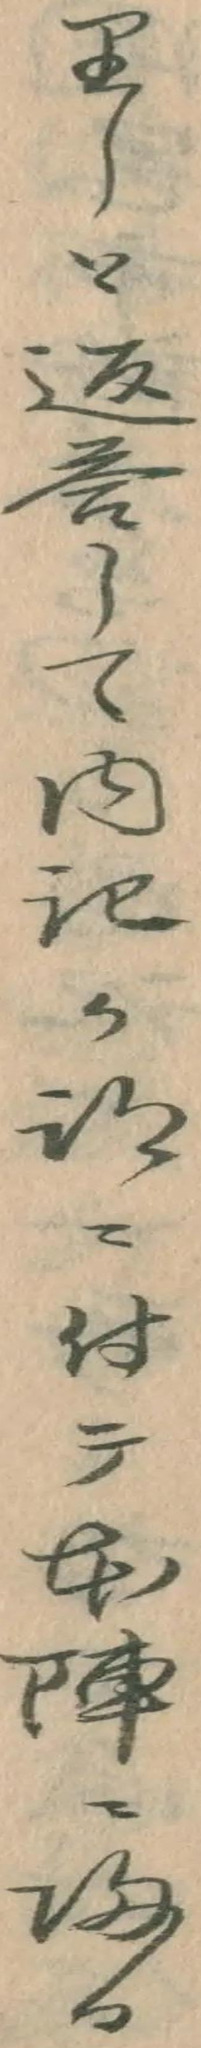里しと返答して内記か跡に付て本陣に帰る

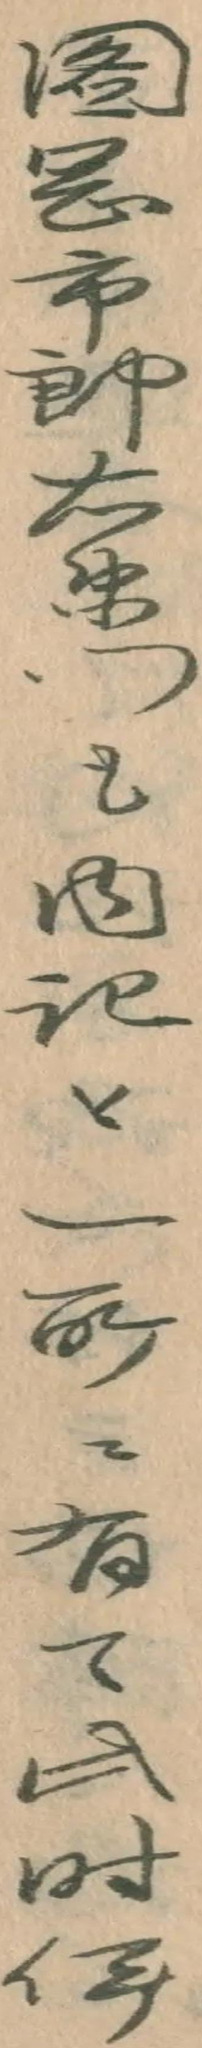図岡市郎右衛門も内記と一所に有て此時伊
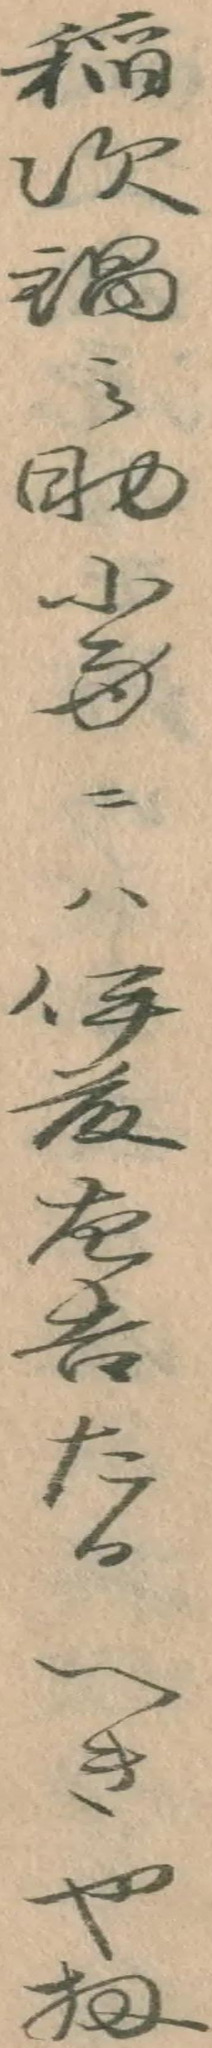稲次鍋之助小身には伊藤左吉たるへきや扨
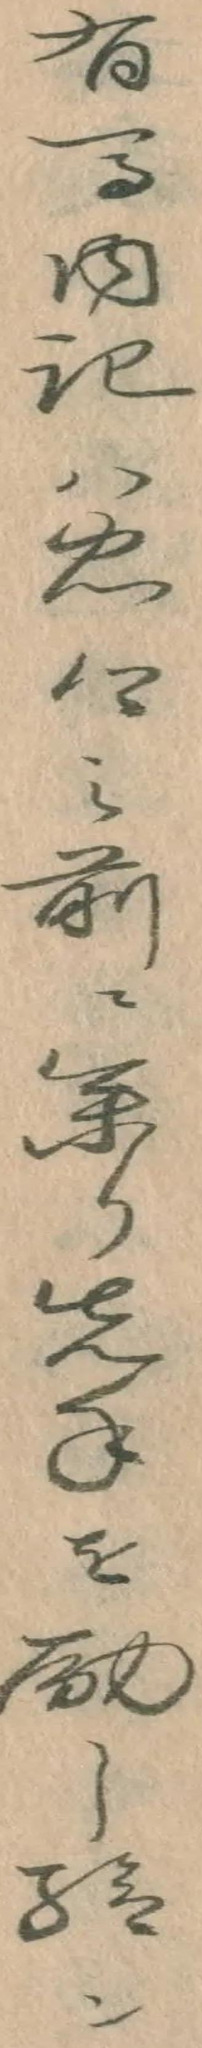有馬内記は忠郷之前に参り先手を励し給ん
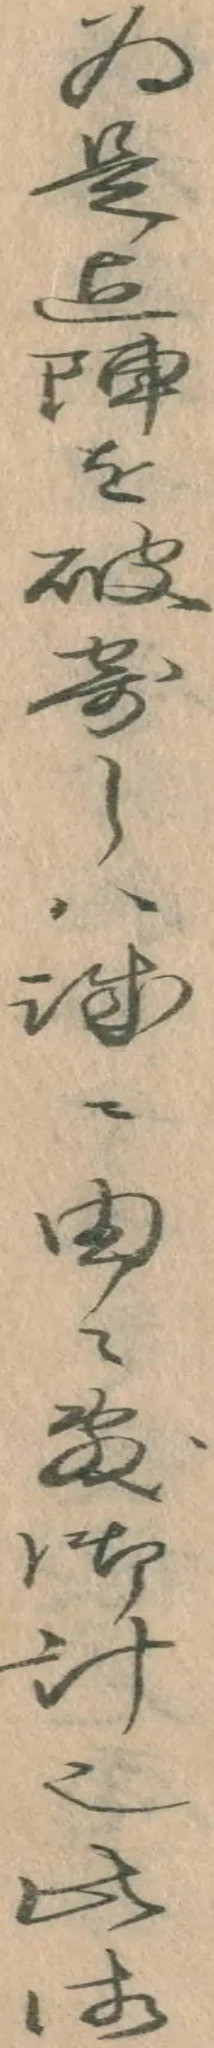ゐ是迄陣を破寄しは誠に由に敷御計也此御
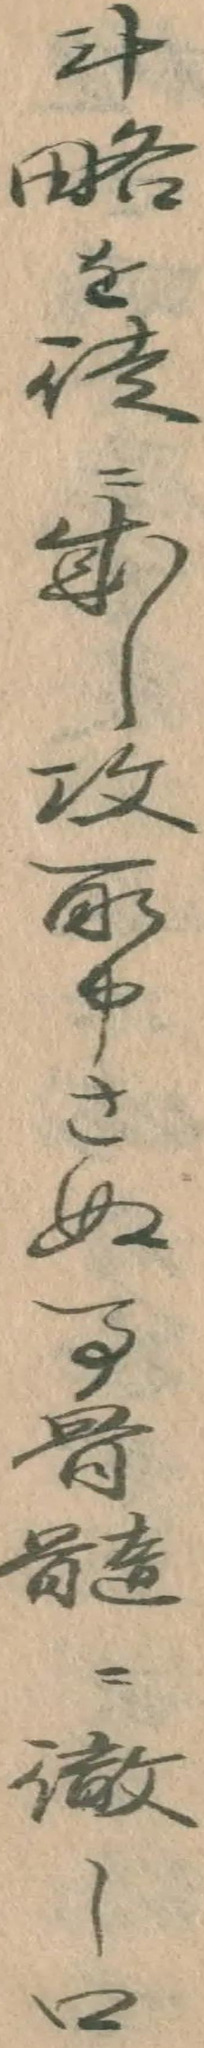斗略を徒に成し攻取申さぬ事骨髄に徹し口
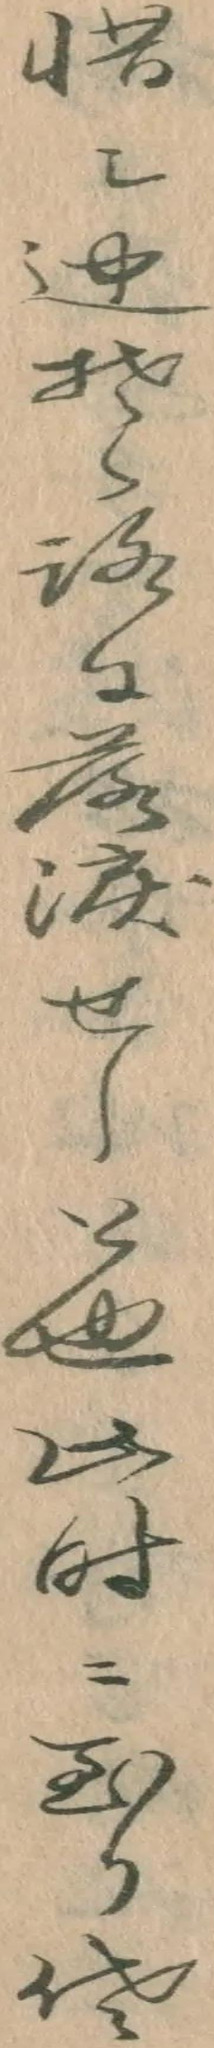惜し迚楚ゝ語尓落涙せしと也此時に至り佐
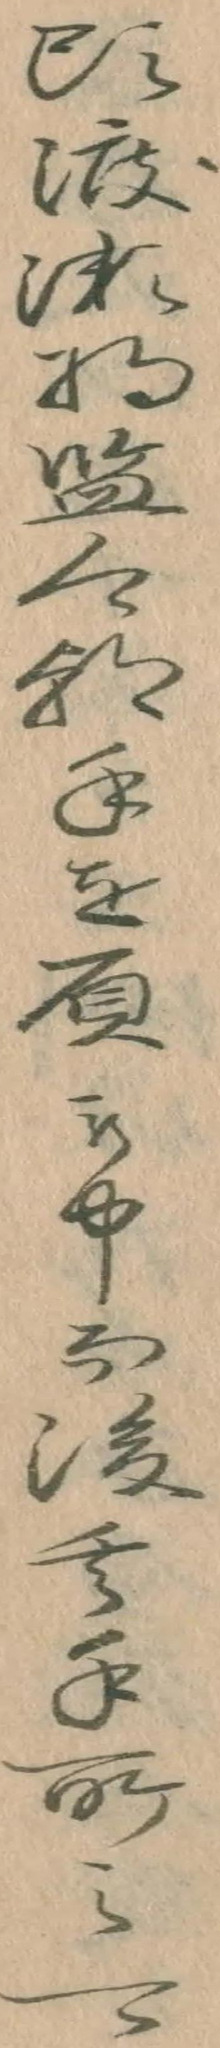頭渡瀬将監今朝手を負被申而後其手所之可
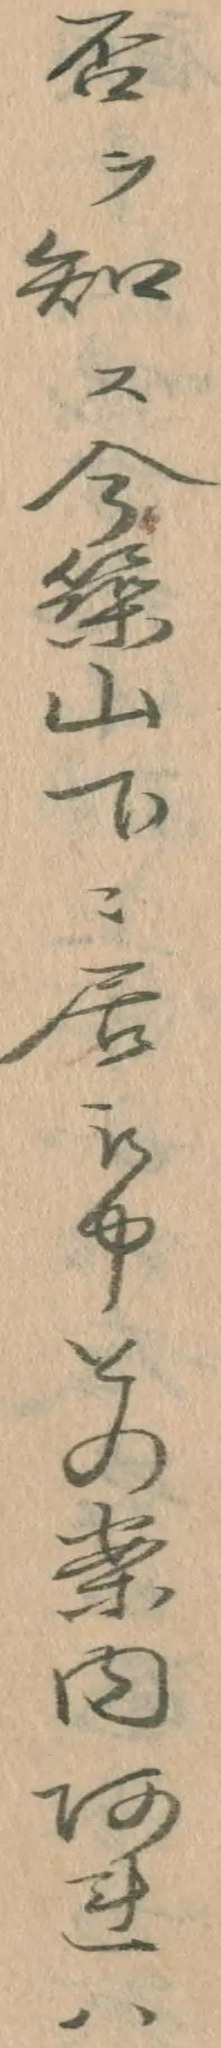否を知す今築山下に居被申との案内阿連は
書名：切支丹御退治記 49巻. [5]
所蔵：国立国会図書館 National Diet Library, JAPAN
